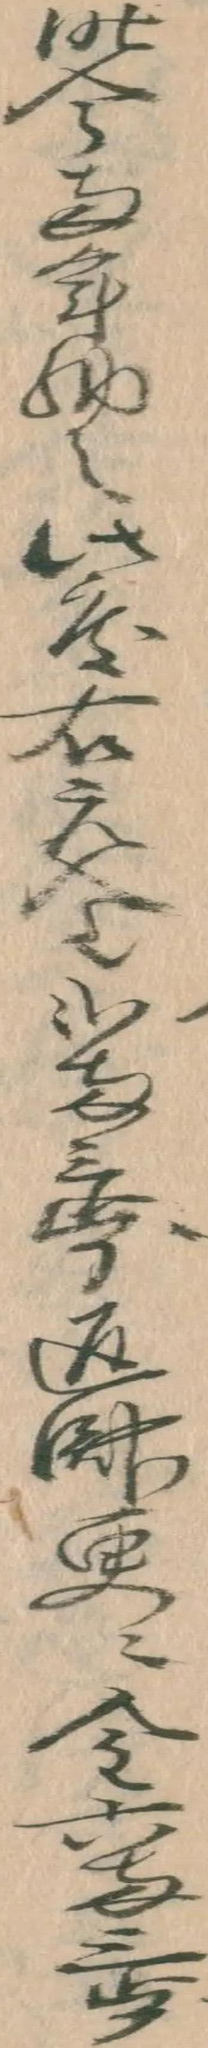昨今両年納之此度右元金弐両三歩返済更ニ金六両三分
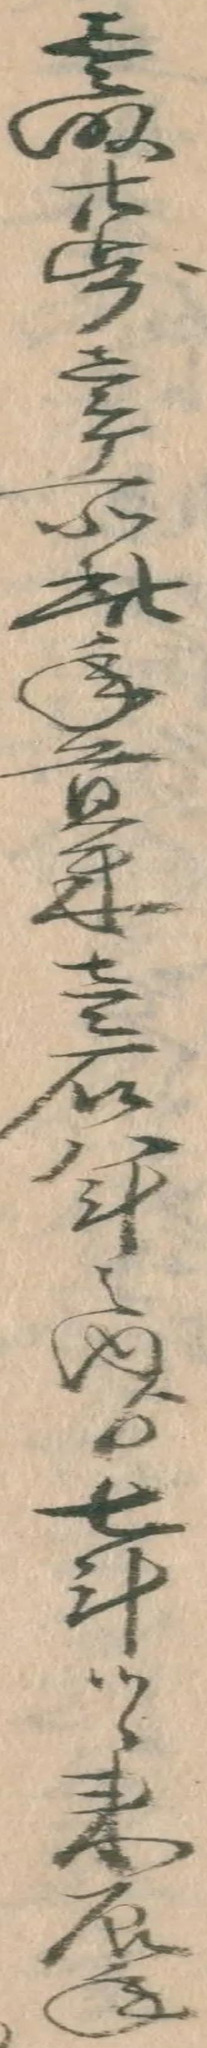壱畝廿歩壱ケ所此年貢米壱石八斗之内ゟ七斗ツヽ来辰年
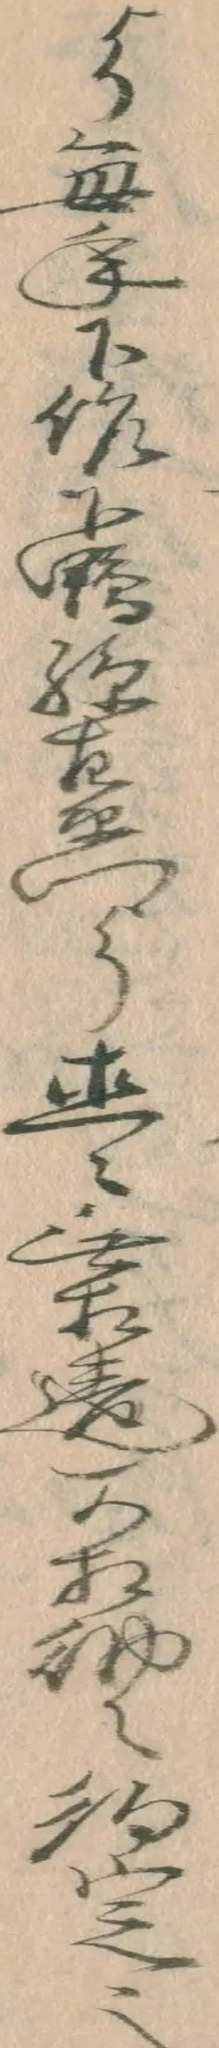より毎年下作下鴨孫左衛門より直々無相違可相納候約定也
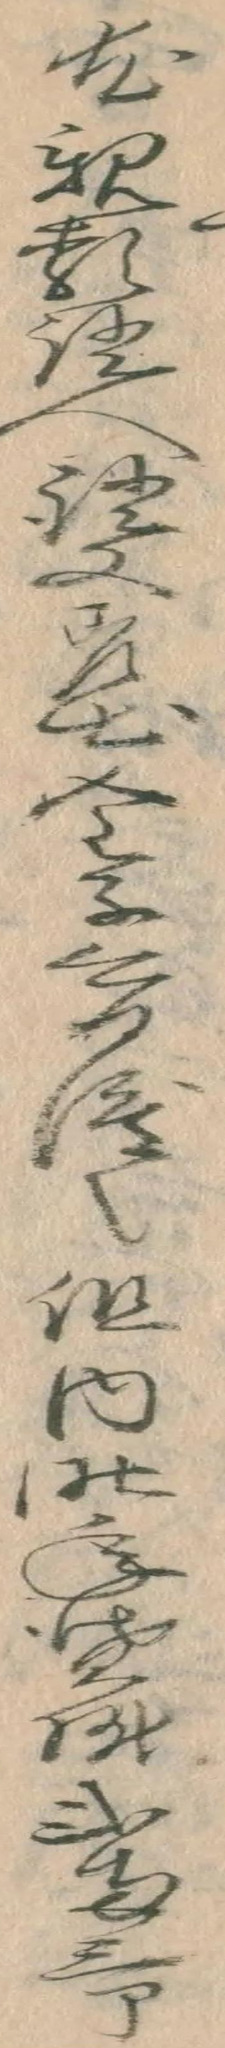尤親類證人證文差出金子今日渡也但内昨年貸附弐両三分
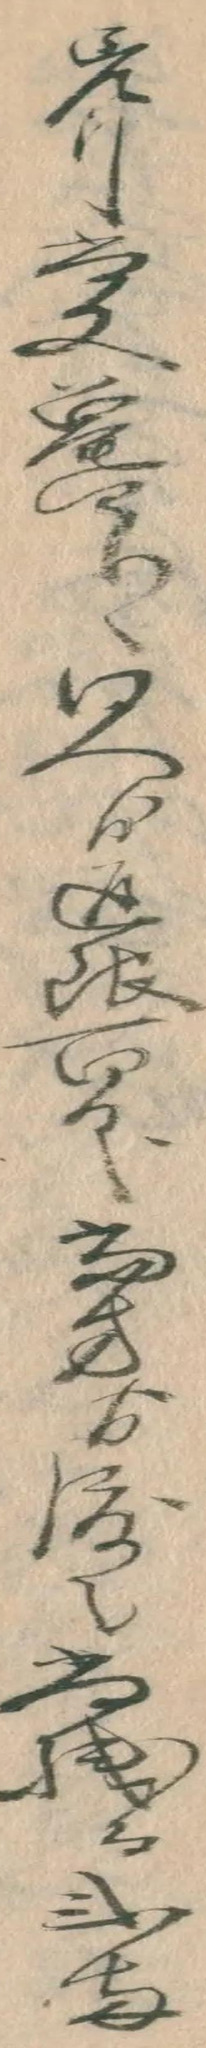差引尚又亀四郎ヘ同人ゟ追銀百匁當方ゟ渡也尚残而弐両
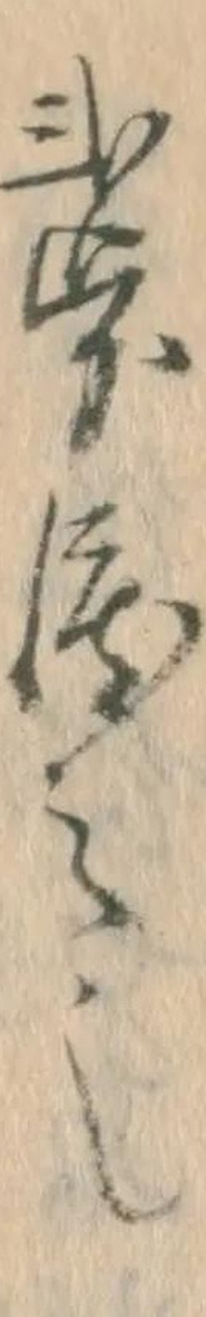弐歩渡之也
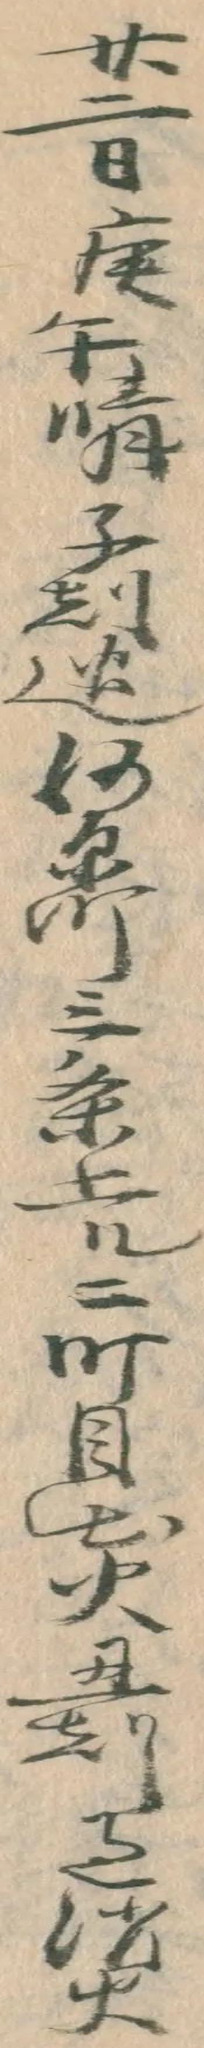廿二日庚午晴子刻過河原町三条上ル二町目出火丑刻過消火
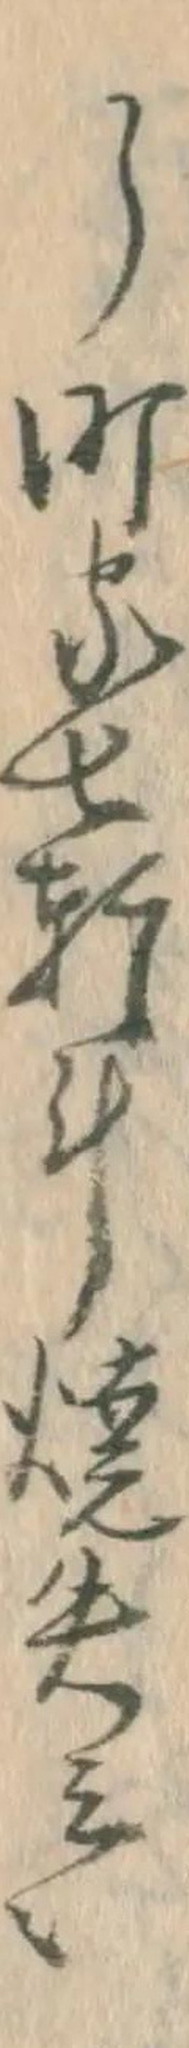了町家七軒斗焼失云々
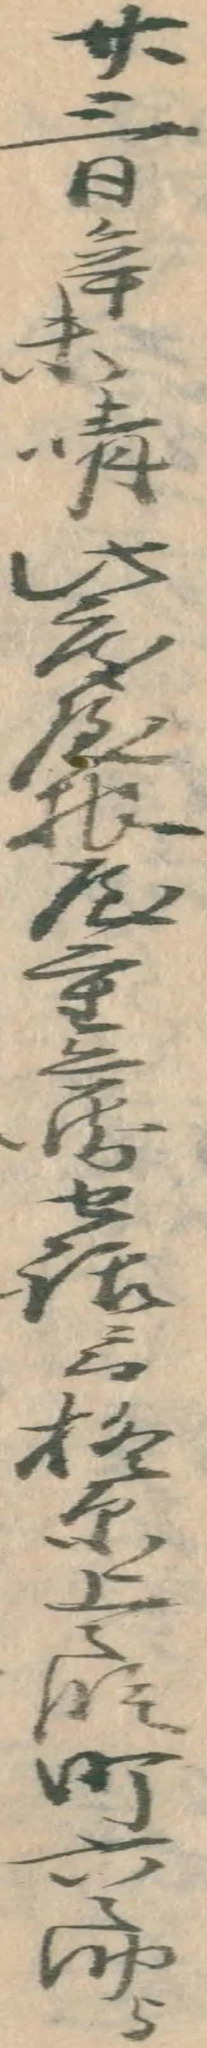廿三日辛未晴此度屋根屋重兵衛世話ニ而柊原上之段町六之助与
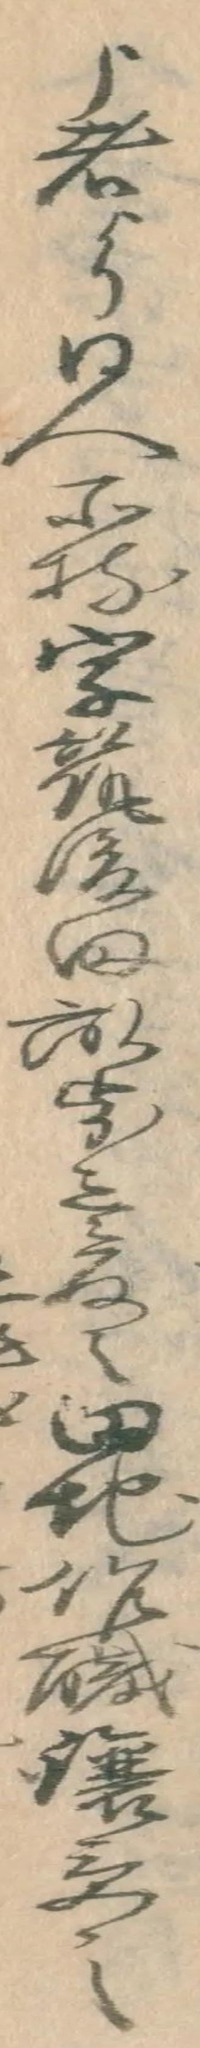申者より同人所持字筑後田畝歩壱反之田地作職譲受也
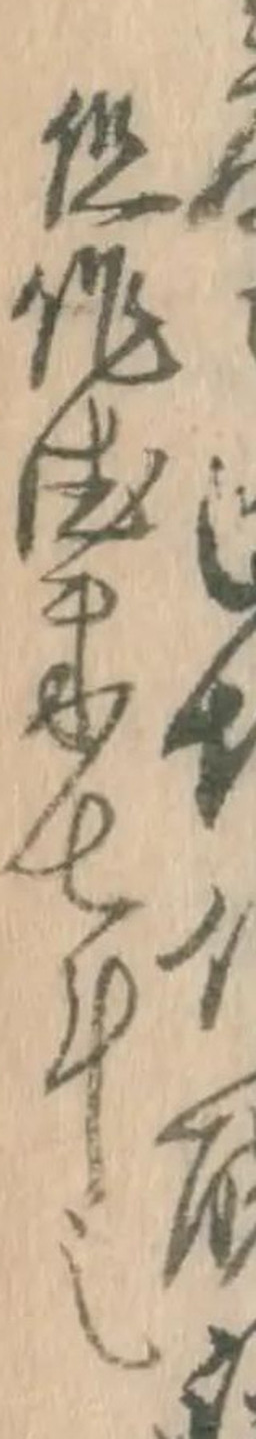但作徳来七斗也

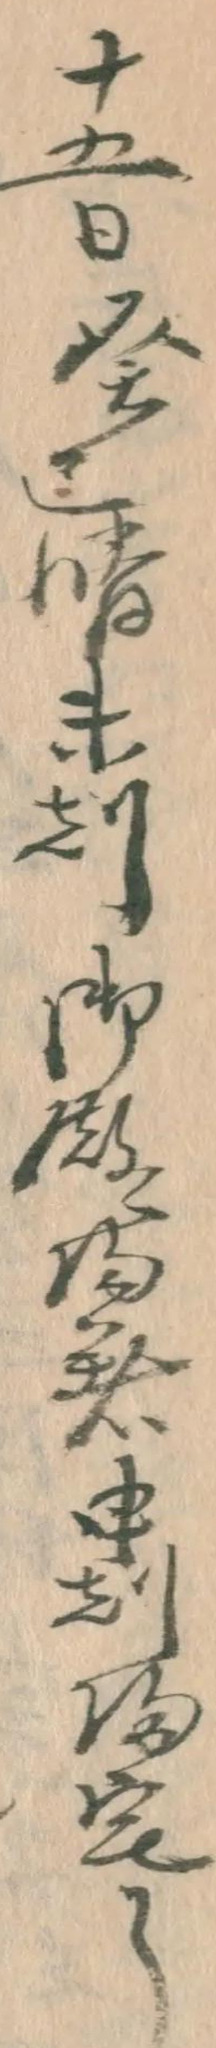十五日癸巳晴未刻御殿へ帰暑申刻帰宅了
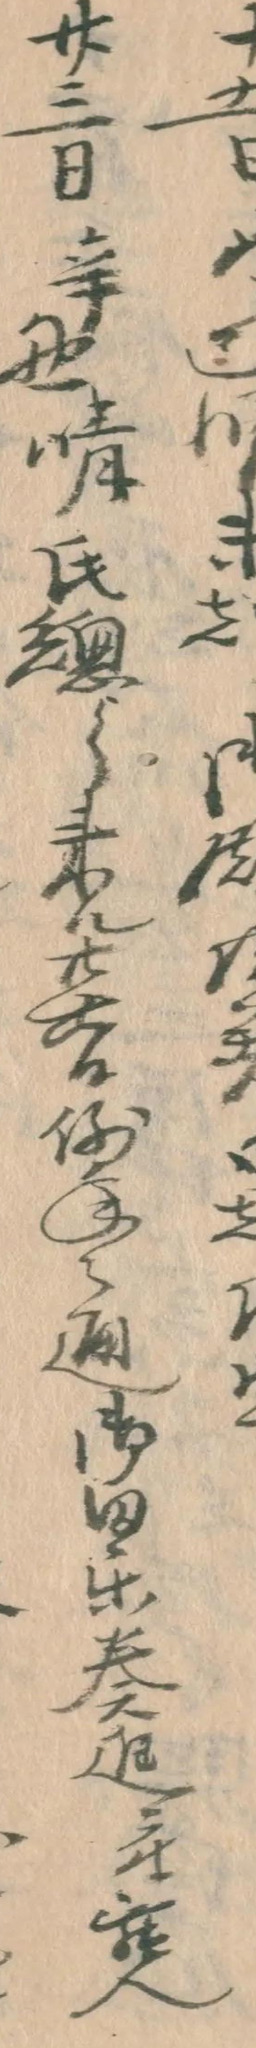廿三日辛丑晴氏總より来ル廿六日例年之通御田楽奏進ニ付舞人
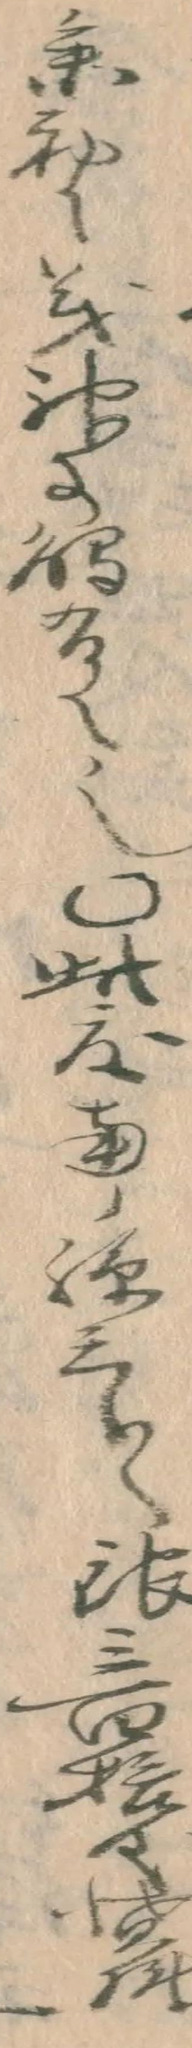参勤之義神事触有之〇此度南ノ源三郎へ銀三百拾匁貸附
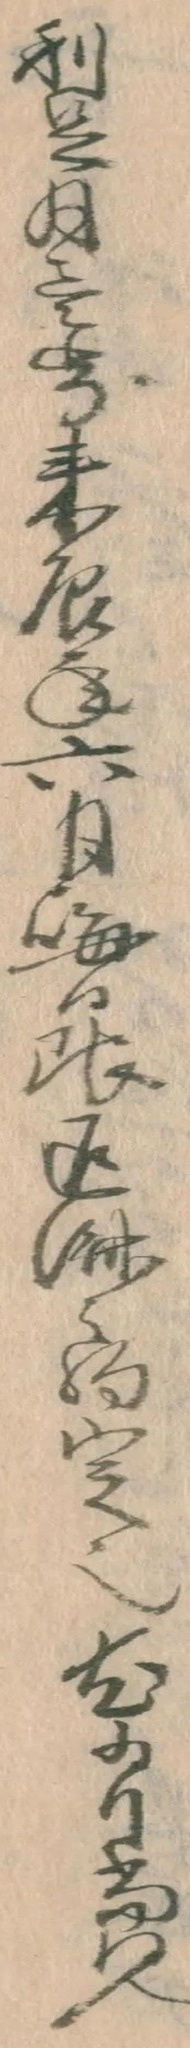利足月壱歩来辰年六月晦日限返済之約定也尤也當同人
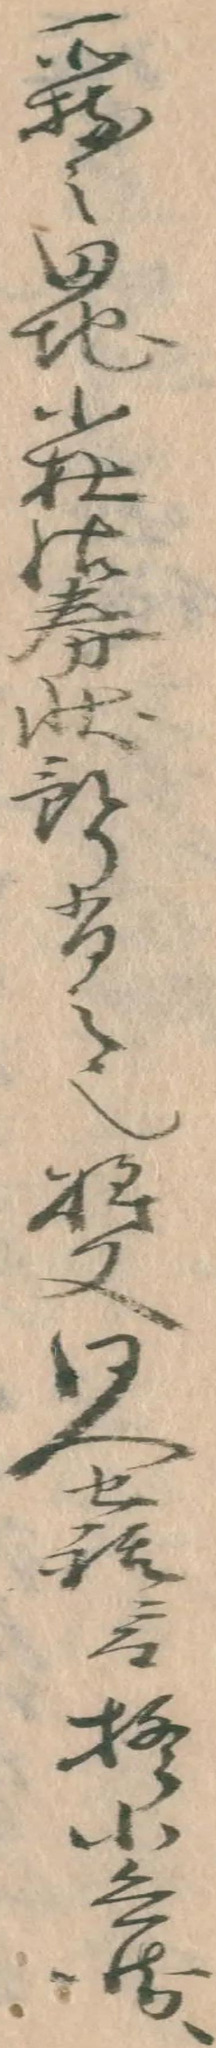所持之田地小牡沽券状預り有之也様又同人世話二而柊ノ小兵衛へ
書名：賀茂社記録. 第66冊
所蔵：国立国会図書館 National Diet Library, JAPAN
